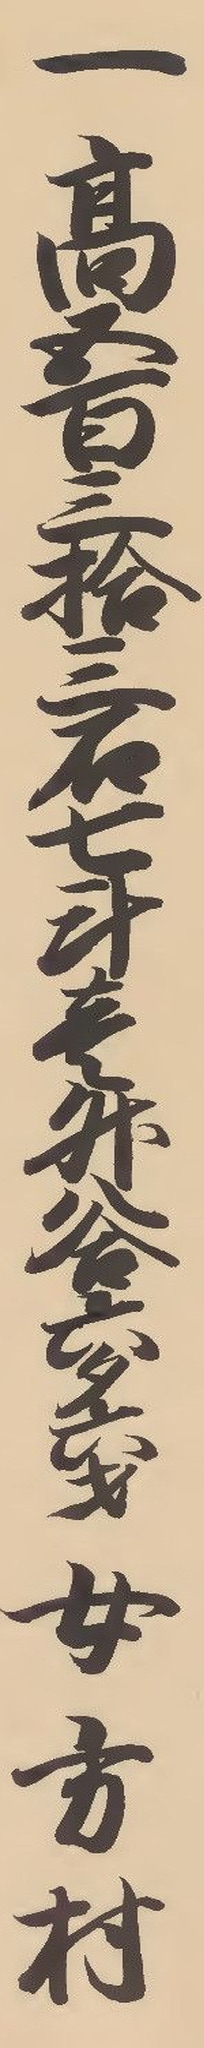一高五百三拾三石七斗壱升八合六勺六才女方村
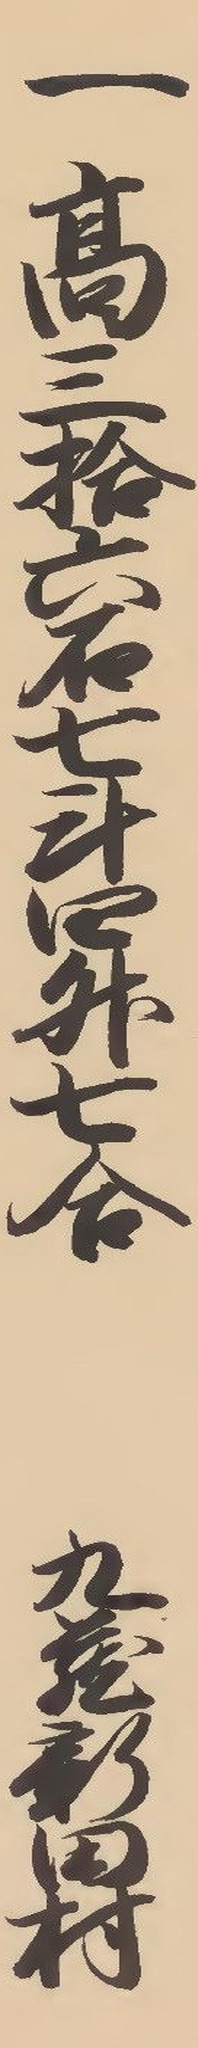一高三拾六石七斗四升七合九蔵新田村
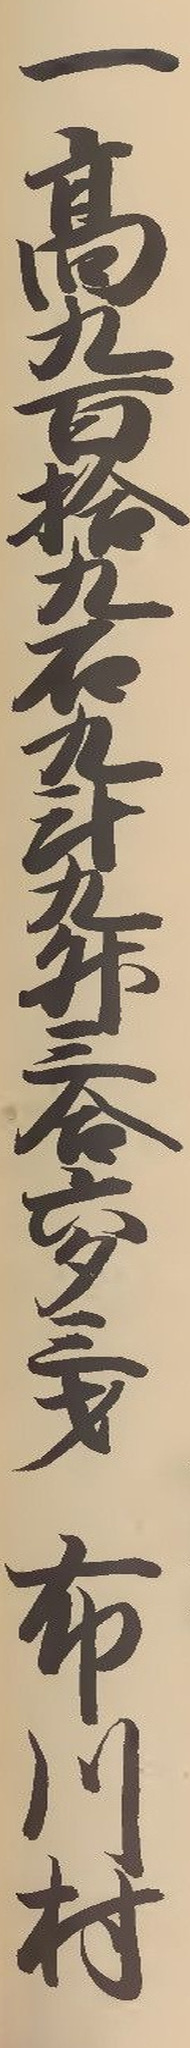一高九百拾九石九斗九升三合六勺三才布川村
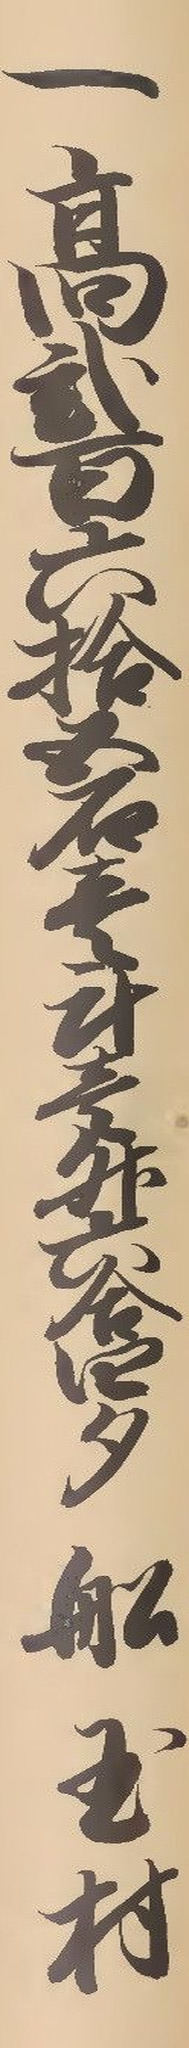一高弐百六拾五石壱斗壱升六合四勺船玉村
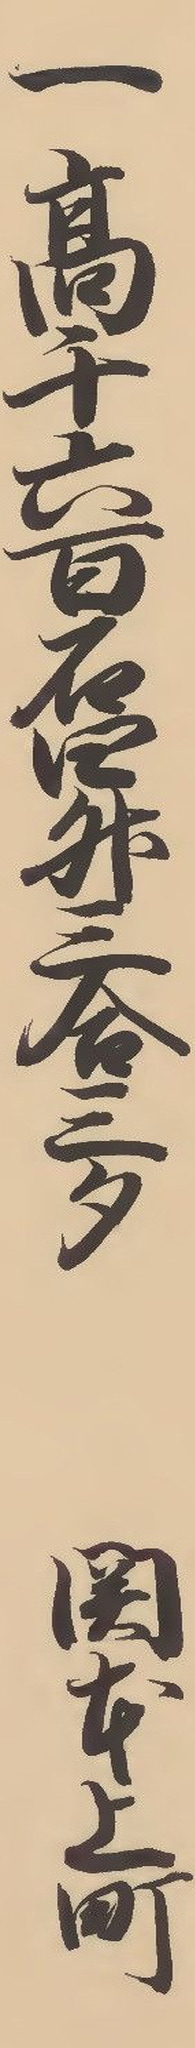一高千六百石四升三合三勺関本上町
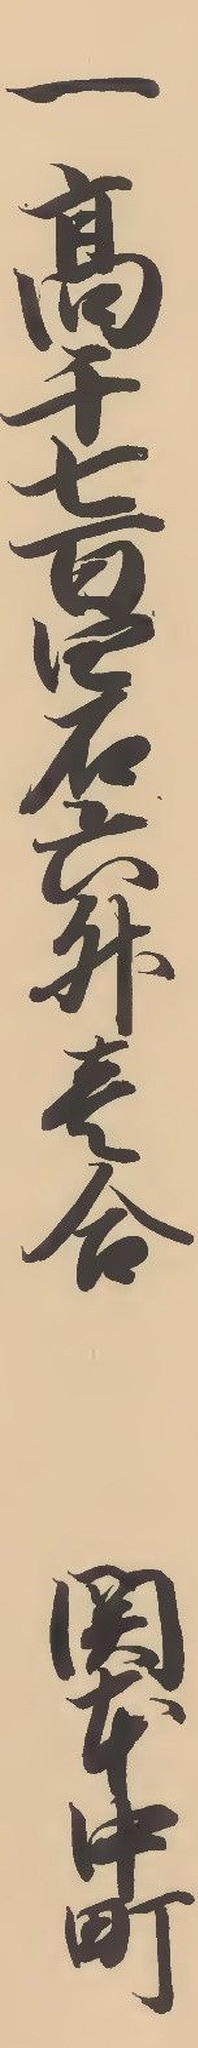一高千七百四石六升壱合関本中町
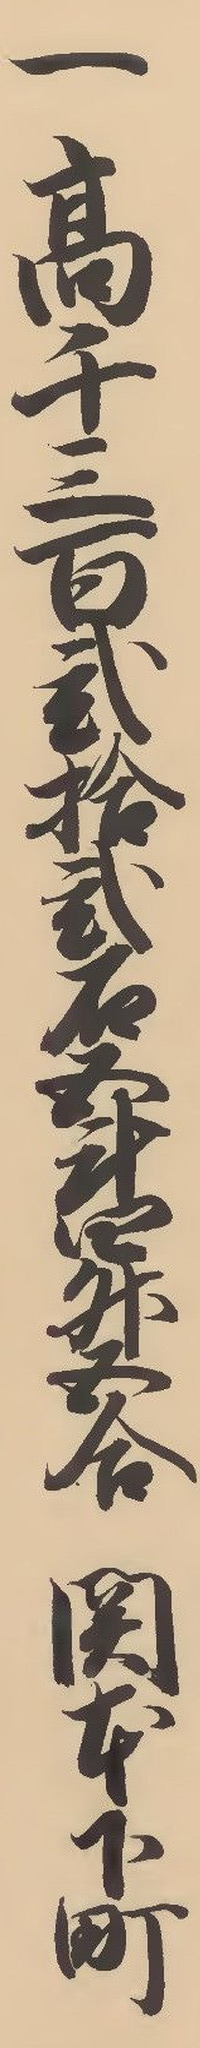一高千三百弐拾弐石五斗四升五合関本下町

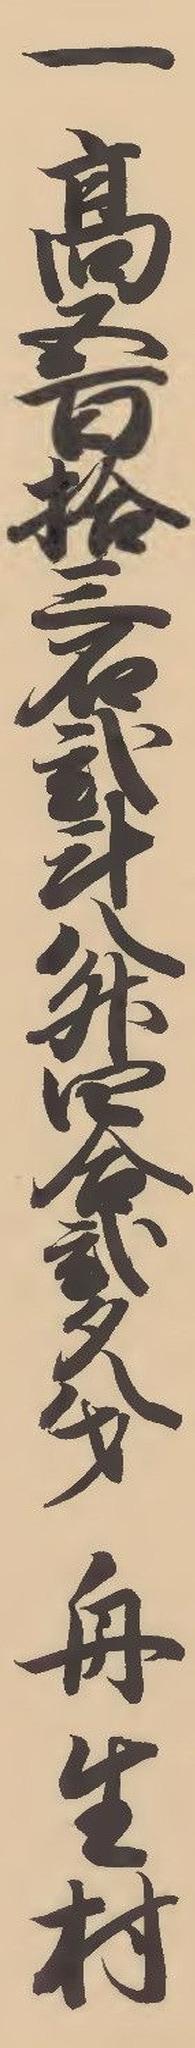一高五百拾三石弐斗八升四合弐勺八才舟生村
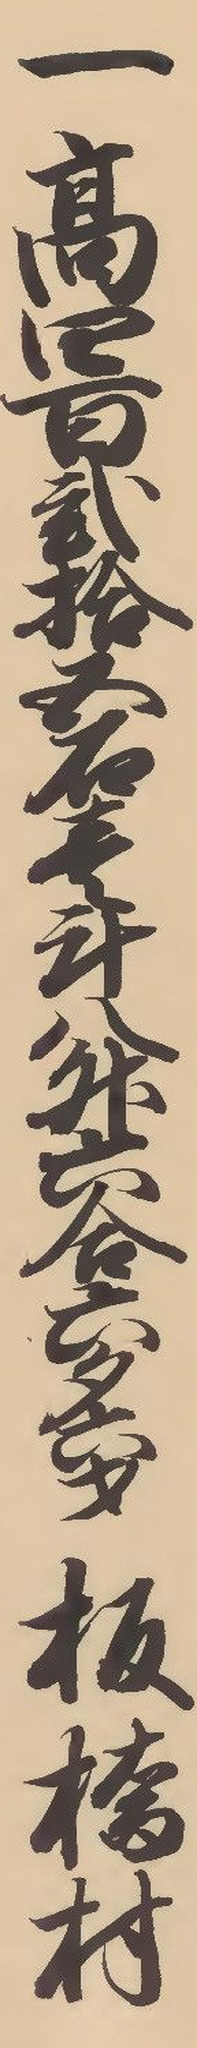一高四百弐拾五石壱斗八升六合六夕六才板橋村
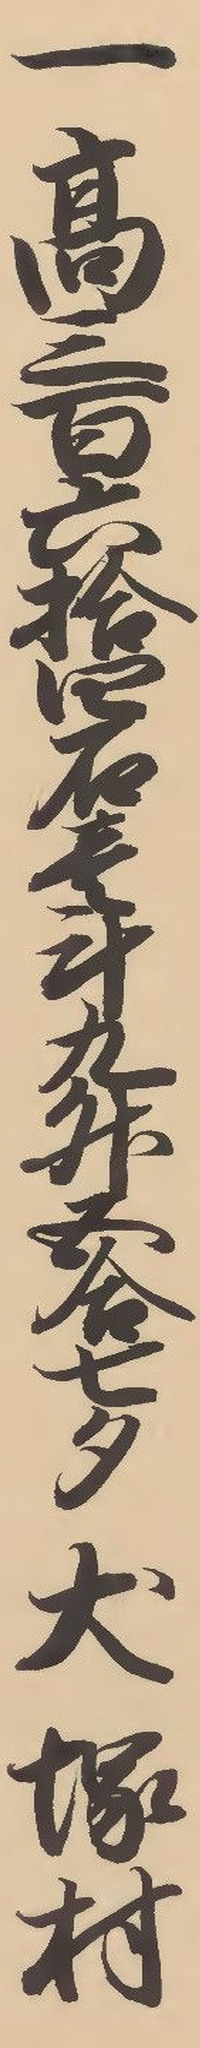一高三百六拾四石壱斗九升五合七勺犬塚村
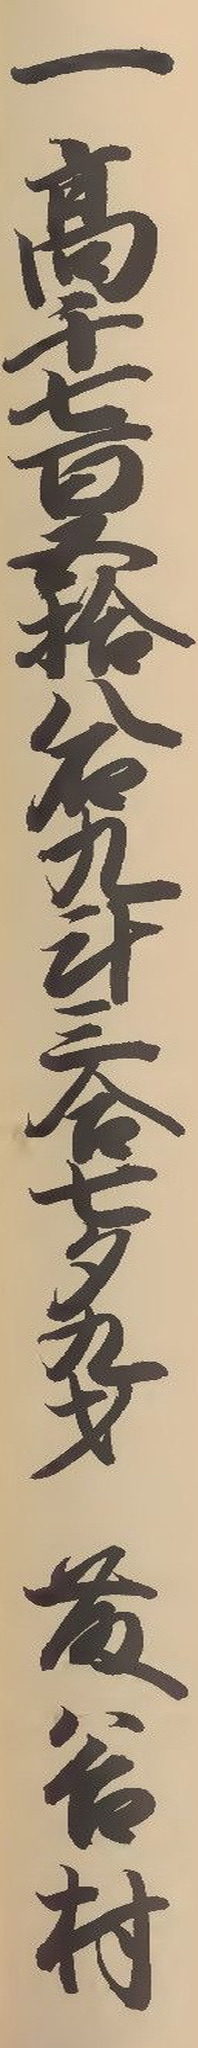一高千七百五拾八石九斗三合七勺九才藤谷村
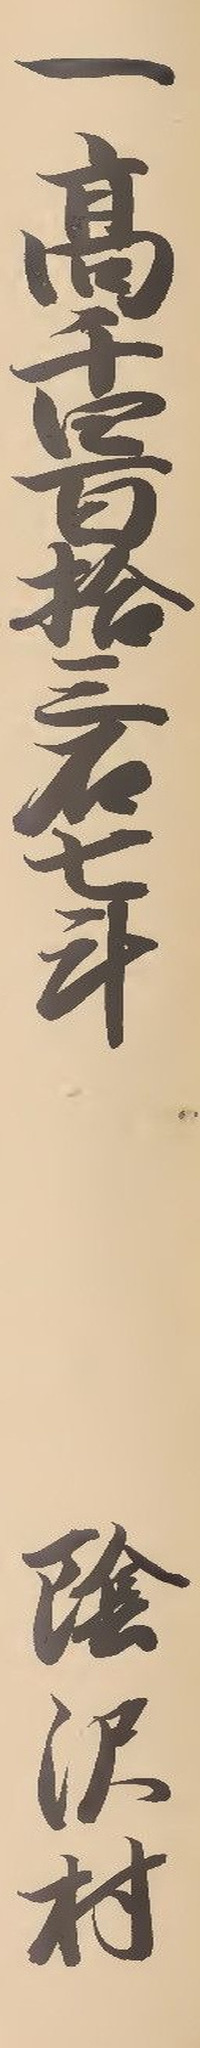一高千四百拾三石七斗陰沢村
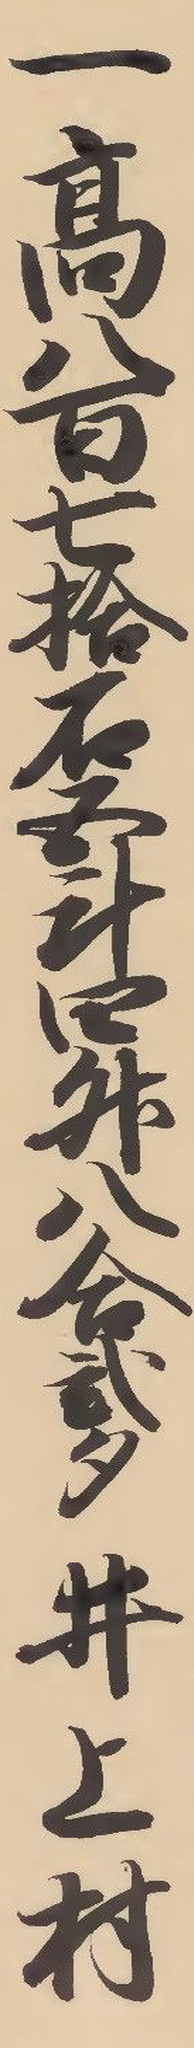一高八百七拾石五斗四升八合弐勺井上村
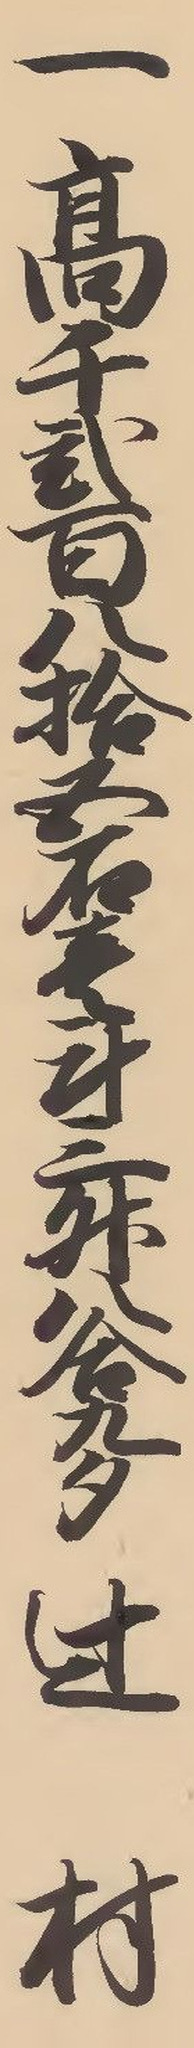一高千弐百八拾五石壱斗三升八合九勺辻村

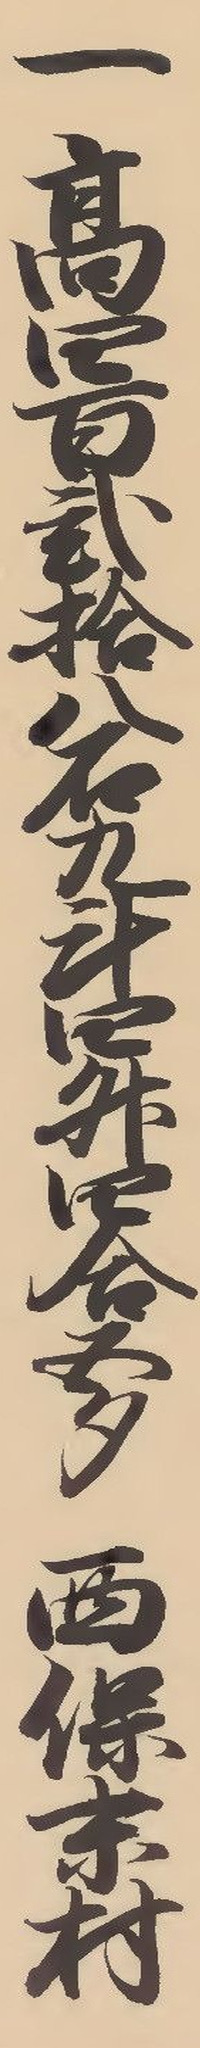一高四百弐拾八石九斗四升四合五勺西保末村
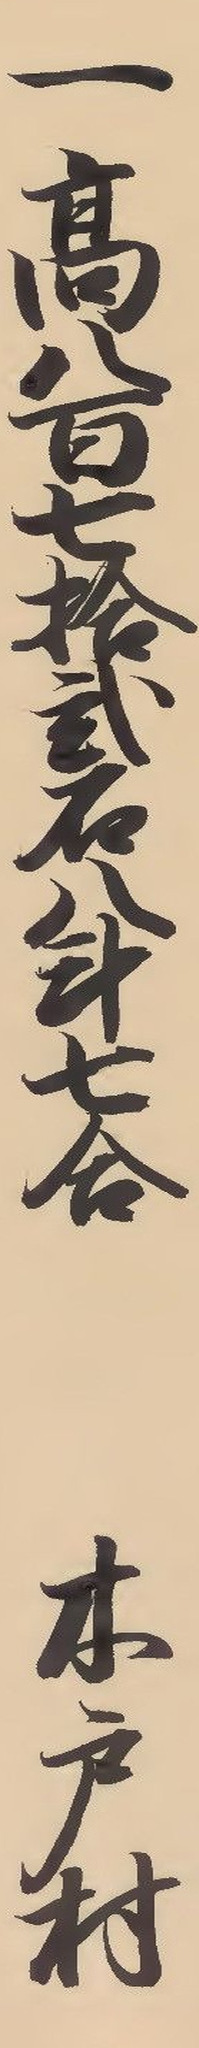一高八百七拾弐石八斗七合木戸村
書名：常陸国郷帳
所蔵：国立公文書館 National Archives of Japan
